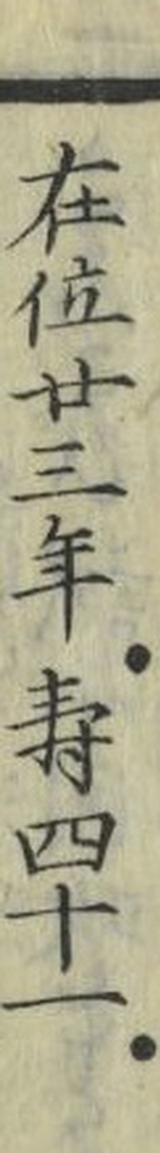在位廿三年・寿四十一・
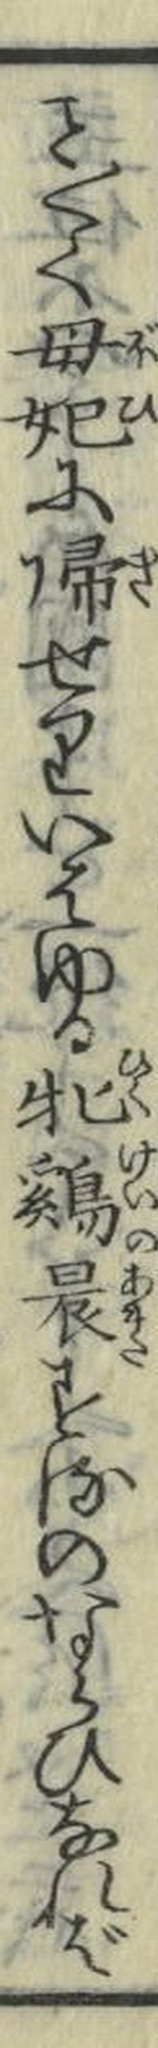こと〳〵く母妃に帰せりいはゆる牝鶏晨するのならひなれば
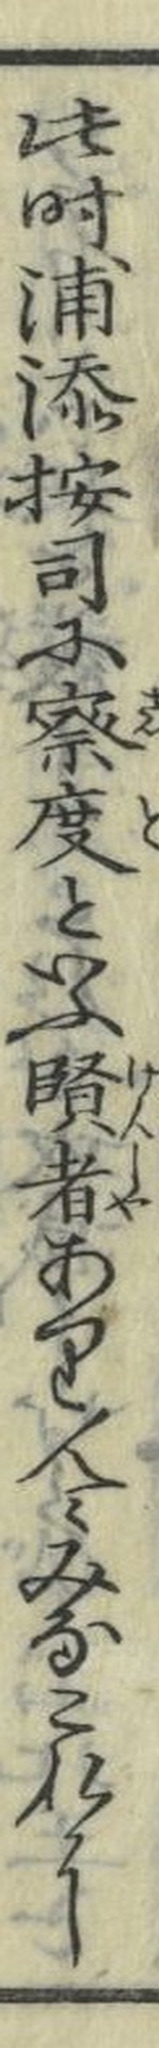此時浦添按司に察度といふ賢者あり人々みなこれに
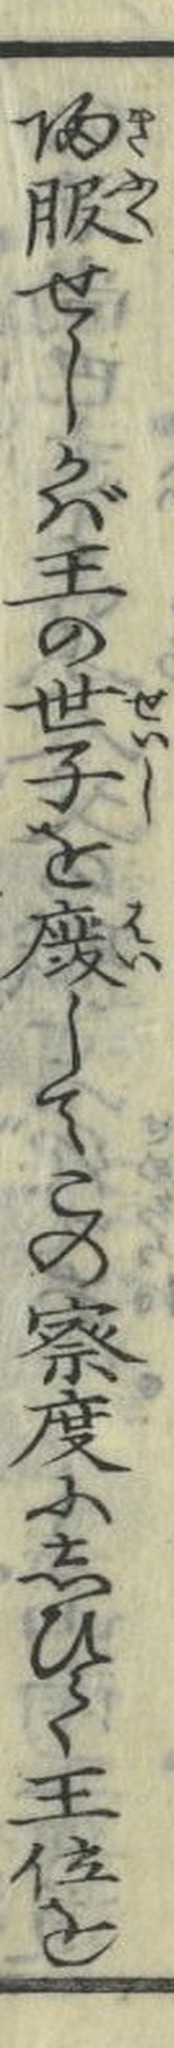帰服せしかば王の世子を廃してこの察度にしひて王位を
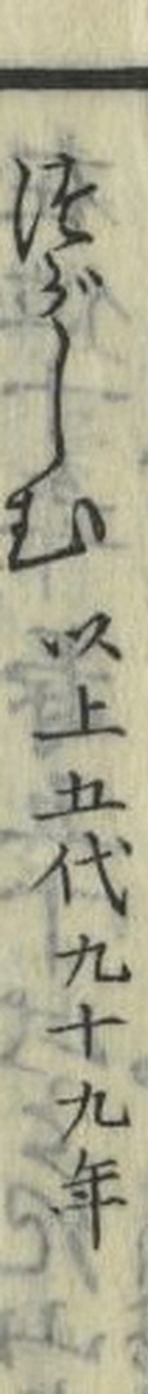つがしむ以上五代九十九年
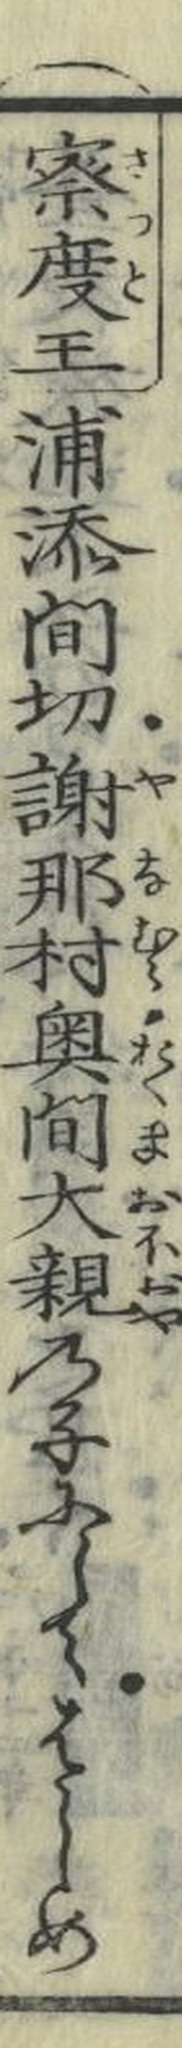(察度王)浦添間切・謝那村・奥間大親の子にして・はしめ
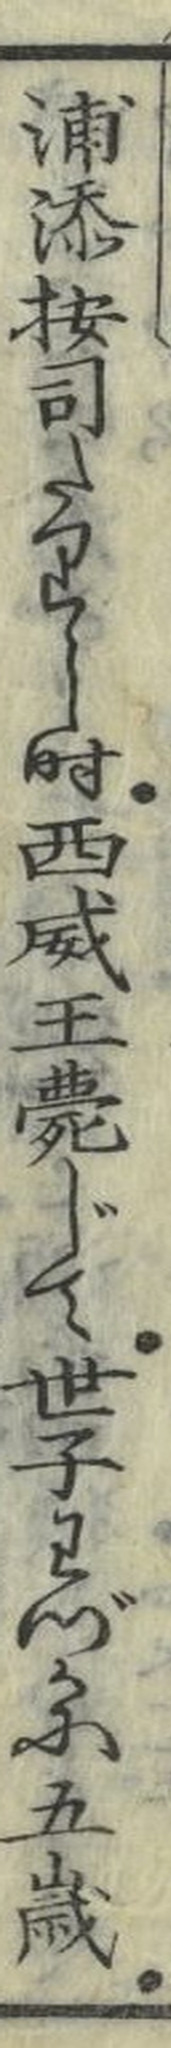浦添按司たりし時・西威王薨じて・世子わづかに五蔵・
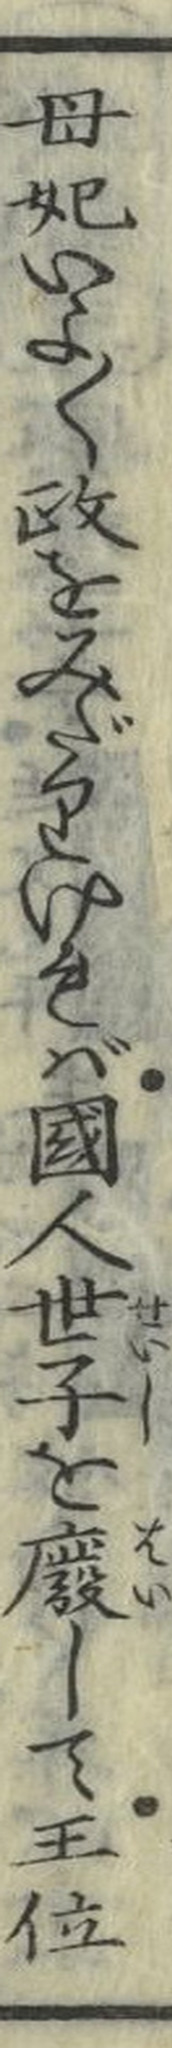母妃いよ〳〵政をみだりければ・國人世子を廃して・王位

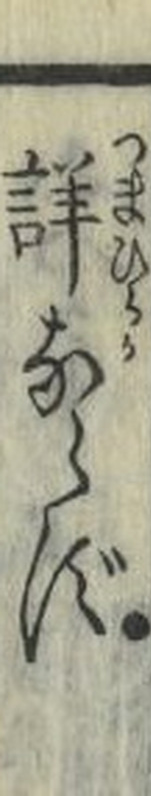詳ならず
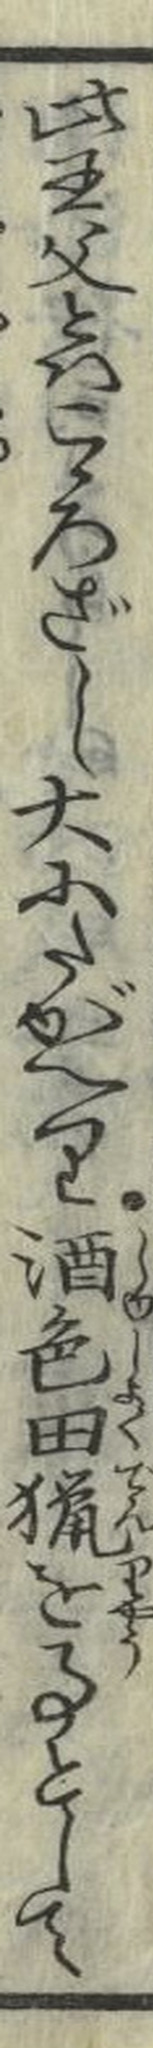此王父とはこころざし大小たがへり・酒色田猟を事として
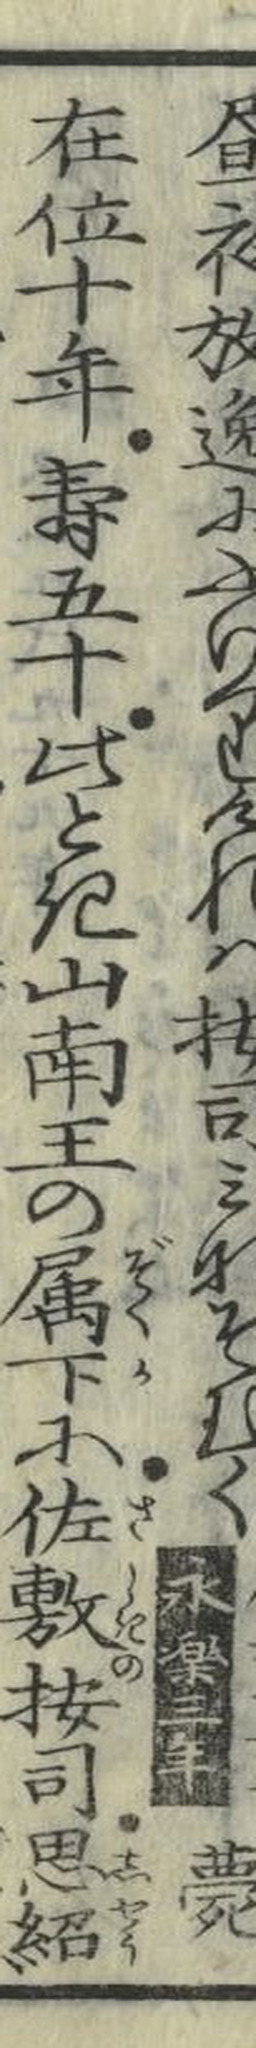在位十年・寿五十・此と紀山南王の属下に・佐敷按司・思紹
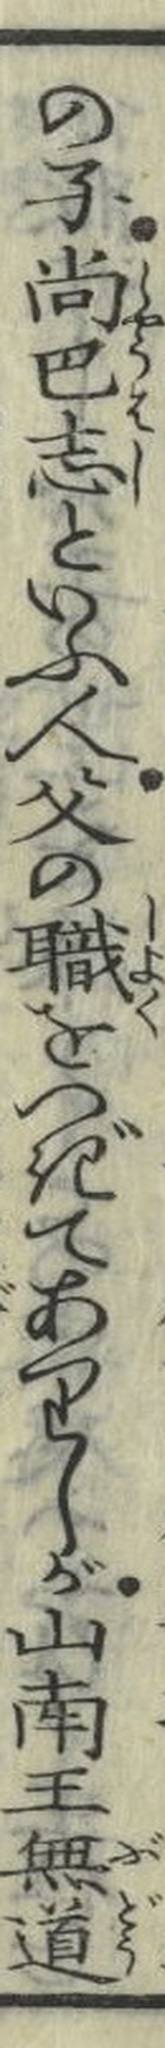の子・尚巴志といふ人・父の職をつぎてありしが・山南王無道
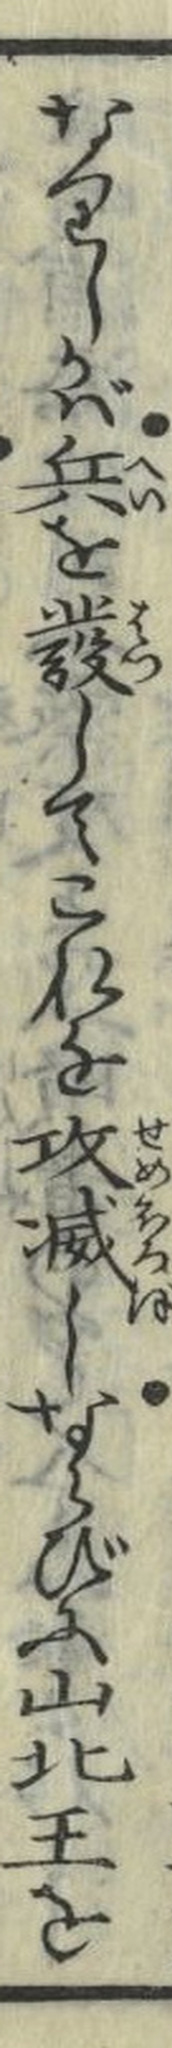なりしかば・兵を発してこれを攻滅し・ならびに山北王を
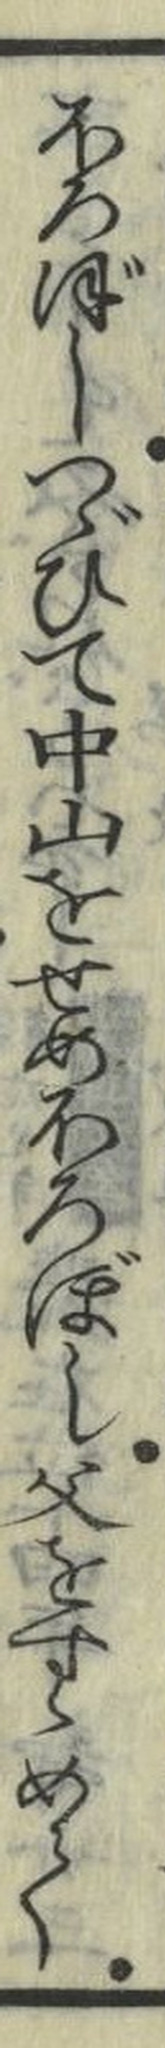ほろぼし・つゞひて中山をせめほろぼし・父をすすめて・
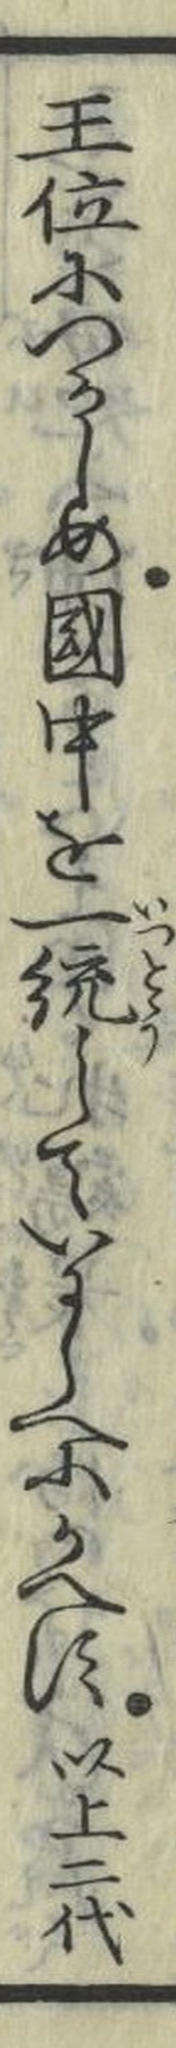王位につかしめ・国中を一統していにしへにかへす・以上二代
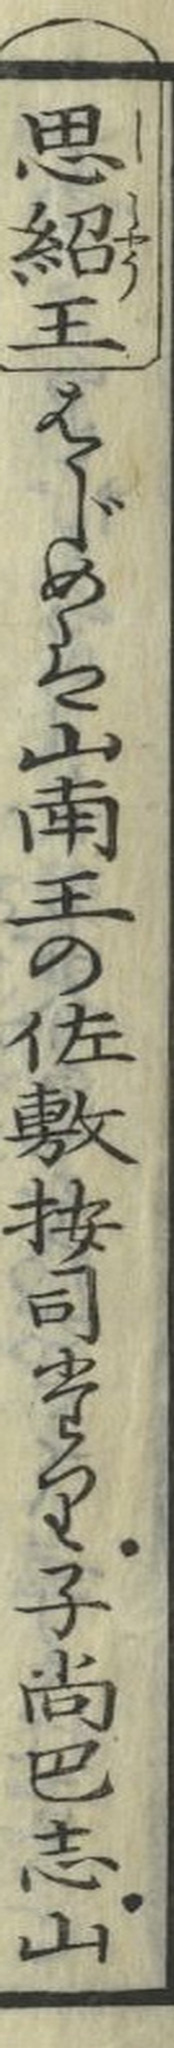思紹王はじめは山南王の佐敷按司たり・子尚巴志・山
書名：琉球秊代記 附雑話 全
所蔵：University of the Ryukyus Library
